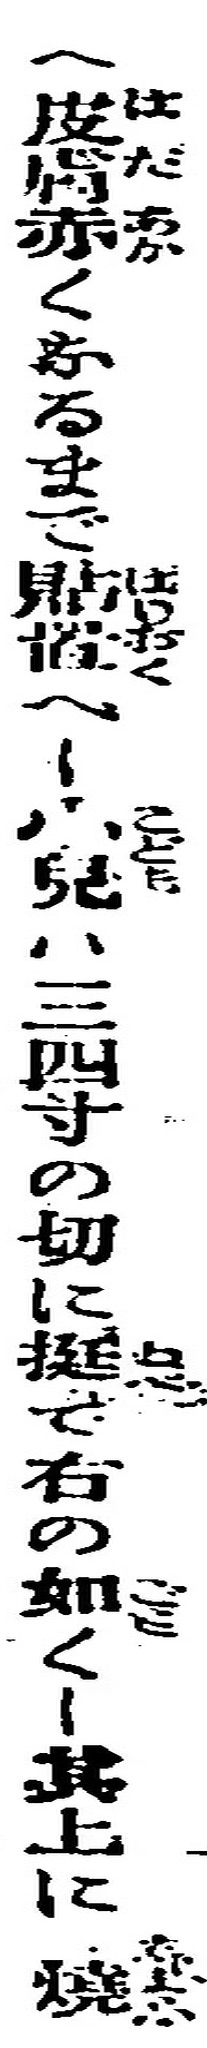へ皮膚赤くなるまで貼置べし小児は三四寸の切に挺て右の如くし其上に焼
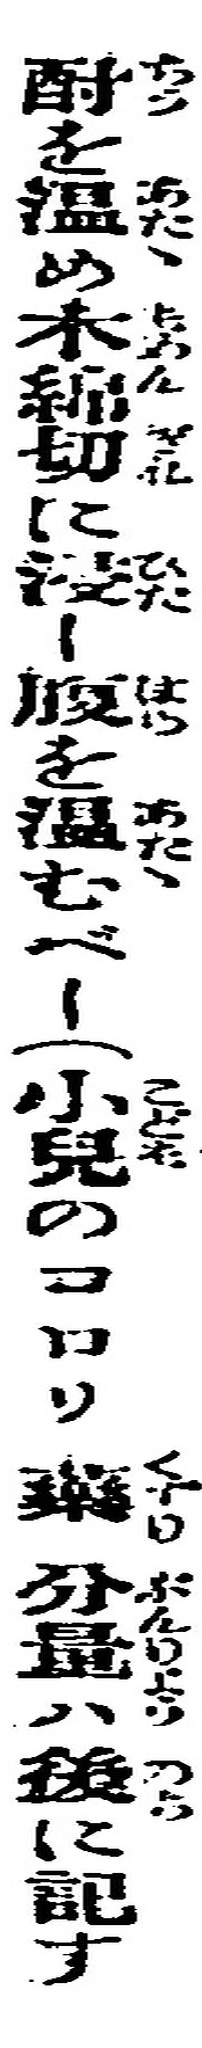酎を温め木綿切に浸し腹を温むべし[小児のコロリ藥分量は後に記す]
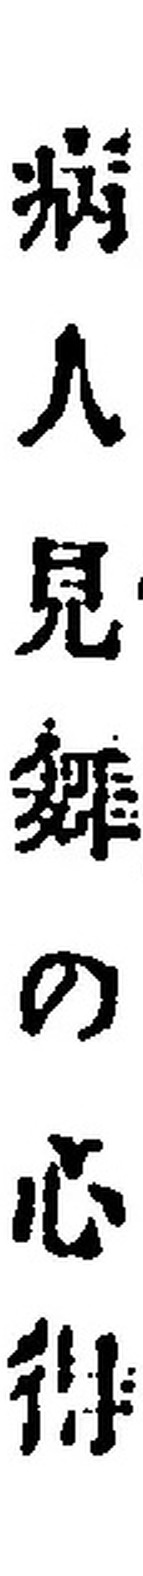病人見舞の心得
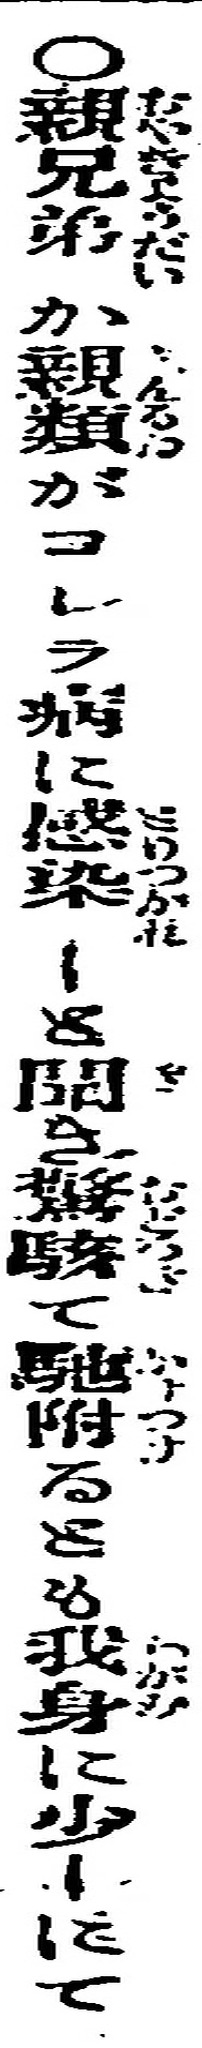〇親兄弟か親類がコレラ病に感染しと聞き驚駭て駆付るとも我身に少しにて
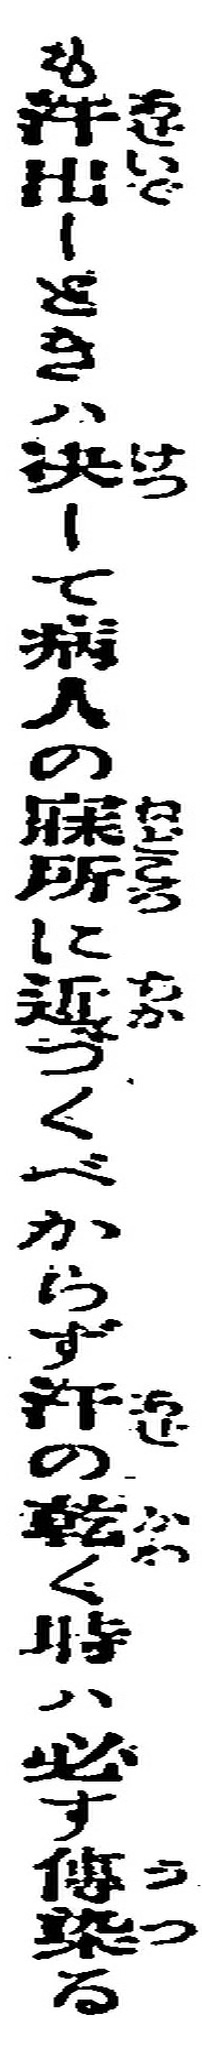も汗出しときは決して病人の寝所に近づくべからず汗の乾く時は必ず傳染る
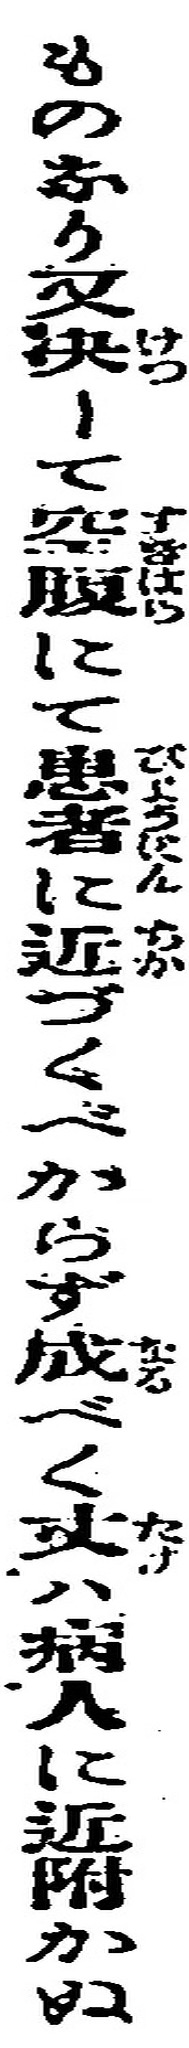ものなり又決して空腹にて患者に近づくべからず成べく丈は病人に近附かぬ
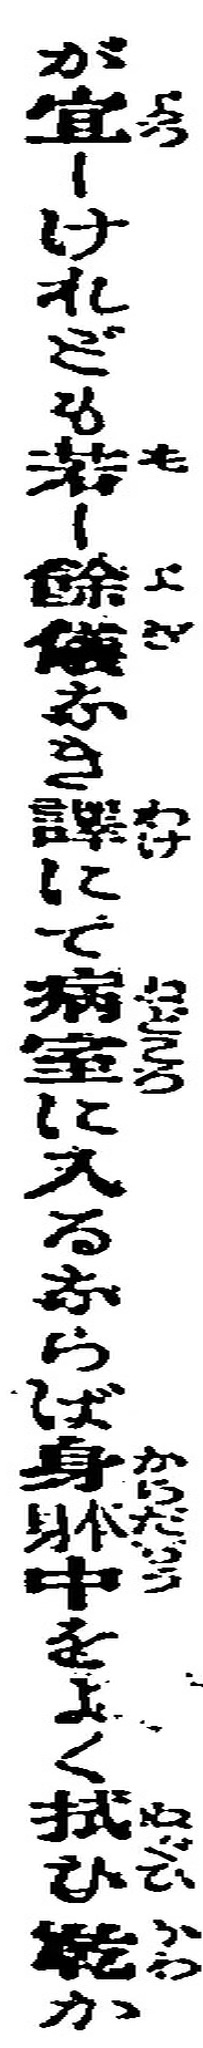が宜しけれども若し餘儀なき譯にて病室に入るならば身躰中をよく拭ひ乾か

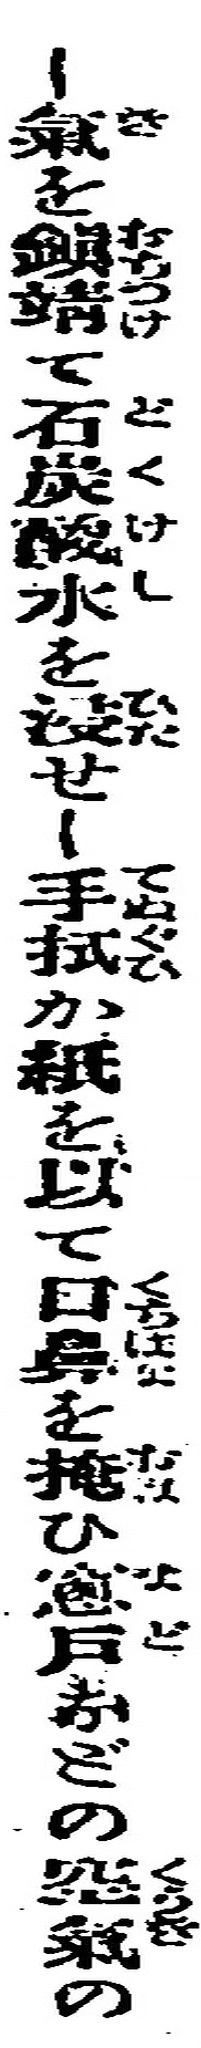し氣を鎮靖て石炭酸水を浸せし手拭か紙を以て口鼻を掩に窓戸などの空氣の
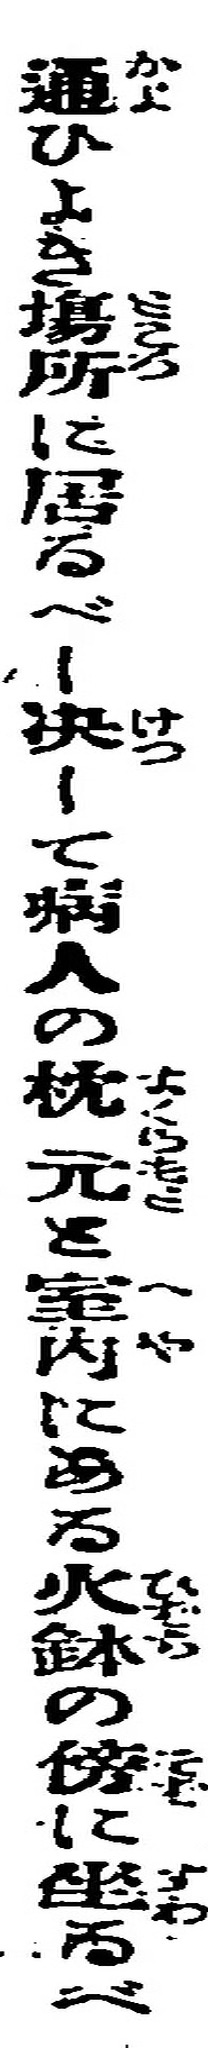通ひよき場所に居るべし決して病人の枕元と室内にある火鉢の傍に坐るべ
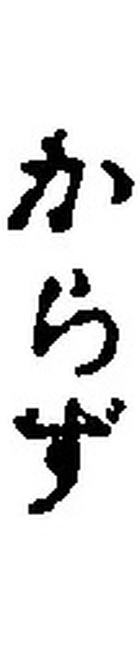からず
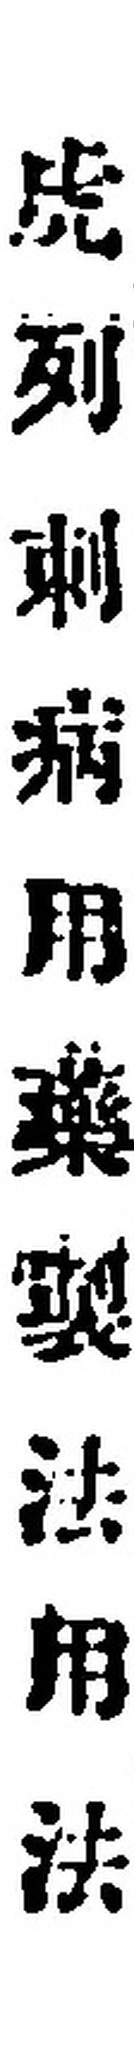虎列刺病用藥製法用法
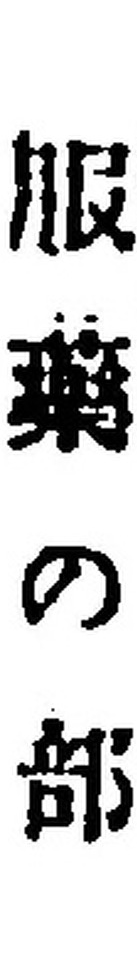服藥の部
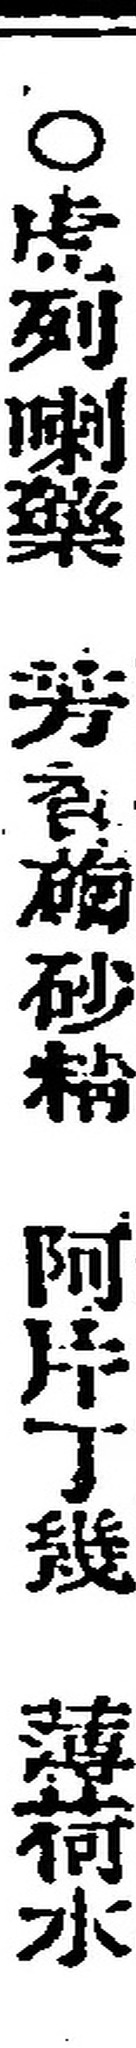〇虎列刺藥芳香砂精阿片丁幾薄荷水
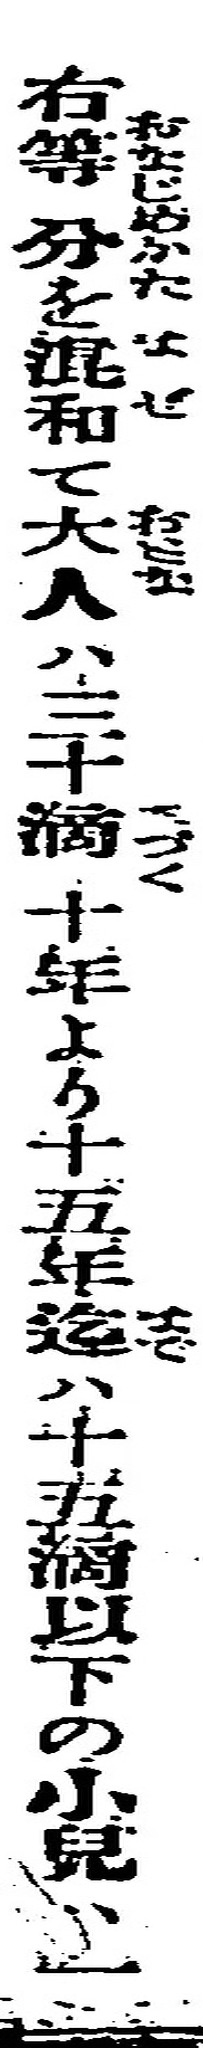右等分を混和て大人は三十滴十年より十五年迄は十五滴以下の小児は一
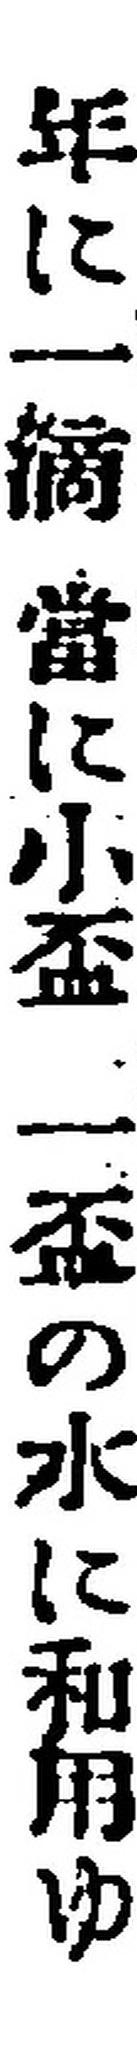年に一滴當に小盃一盃の水に和用ゆ
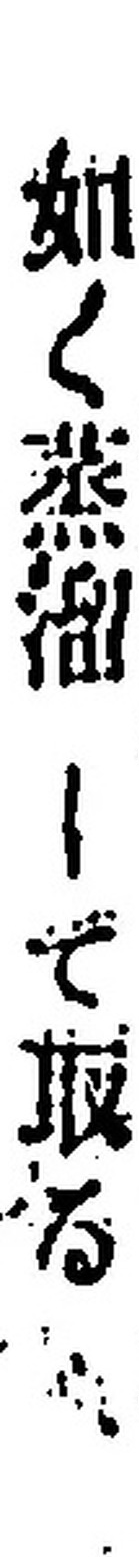如く蒸留して取る
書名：虎列剌病予防養生法訳解
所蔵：国立国会図書館 National Diet Library, JAPAN
